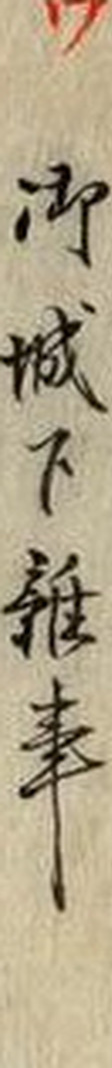ワ御城下雑事
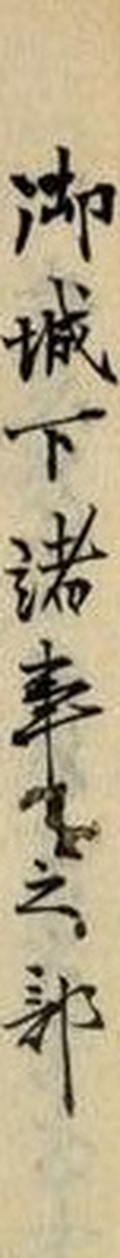御城下諸事之部
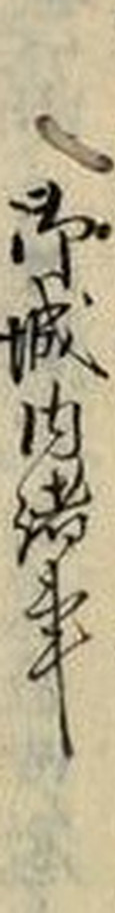御城内諸事
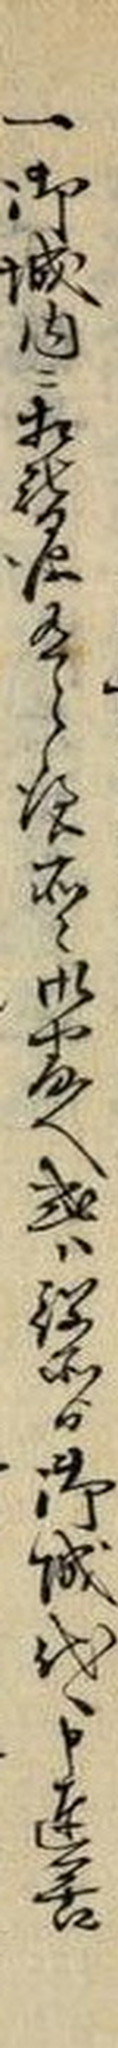一御城内に相替儀有之候得は所々御番人或は役所ゟ御城代ヘ申達筈
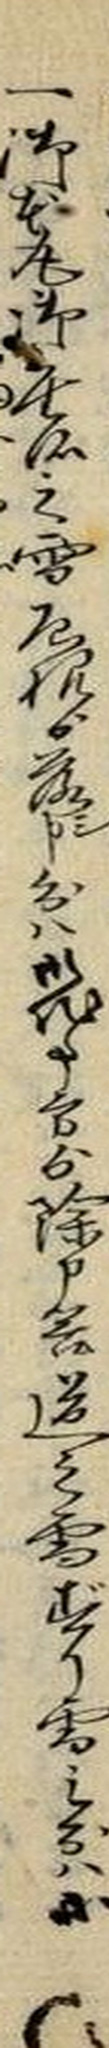一御本丸御座所之雪屋根ゟ落シ申分は御作事方ゟ除申筈道之雪ずり雪之分は御
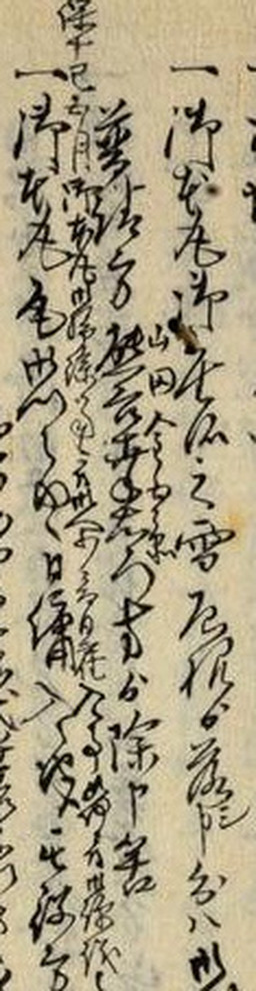普請方熊谷幸右衛門方ゟ除申筈
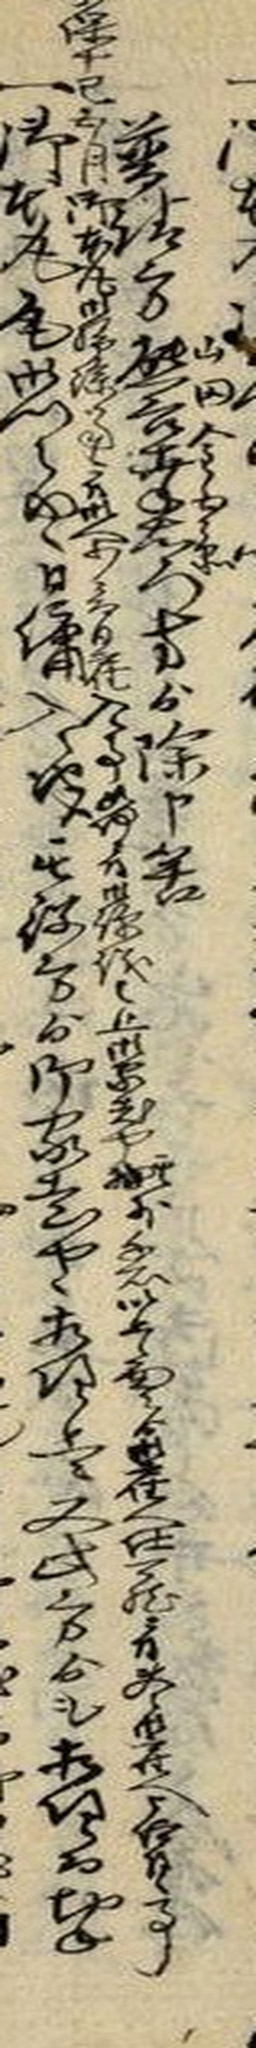一御本丸瓦御門之内へ日傭入候儀は其役方ゟ御家老中へ相伺候上に又此方ゟも相伺候て切手
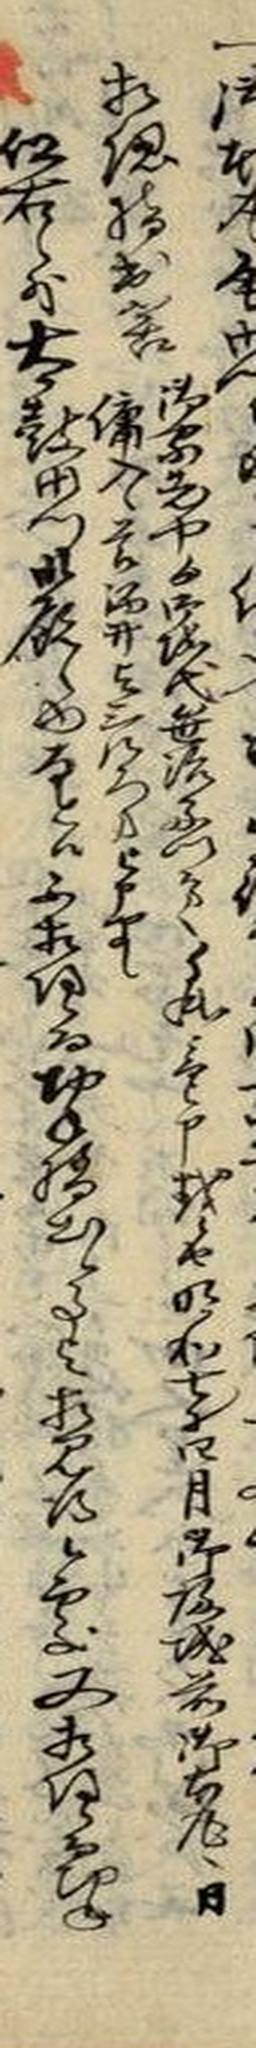但右之外太皷御門御厩之内なとは不相伺候て切手指出候事と相見得候処又相伺候て切手
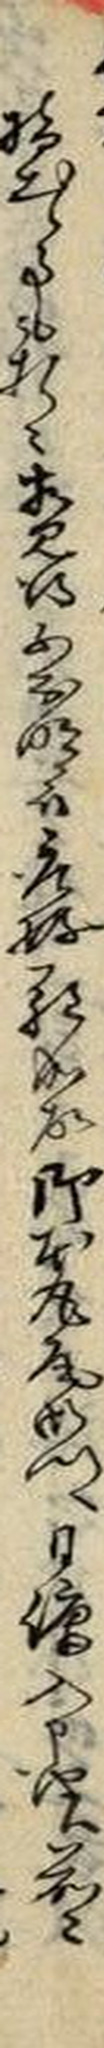指出候事も折々相見得不分明に付取扱難成故御本丸瓦御門へ日庸入申儀は前々
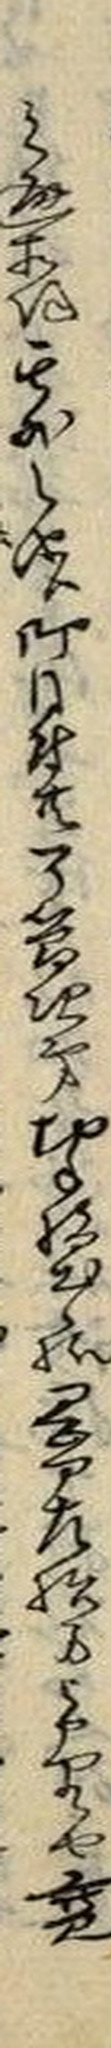之通相伺其外之儀は御目付共了簡次第切手指出候様岡部左膳方被申聞候由寛
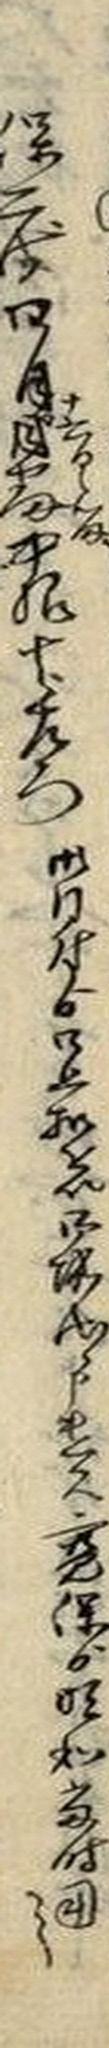保二戌四月◦十六日之留月番中根十郎左衛門御目付ゟ口上控を以て御城代へ申遣ス寛保ゟ明和当時用之
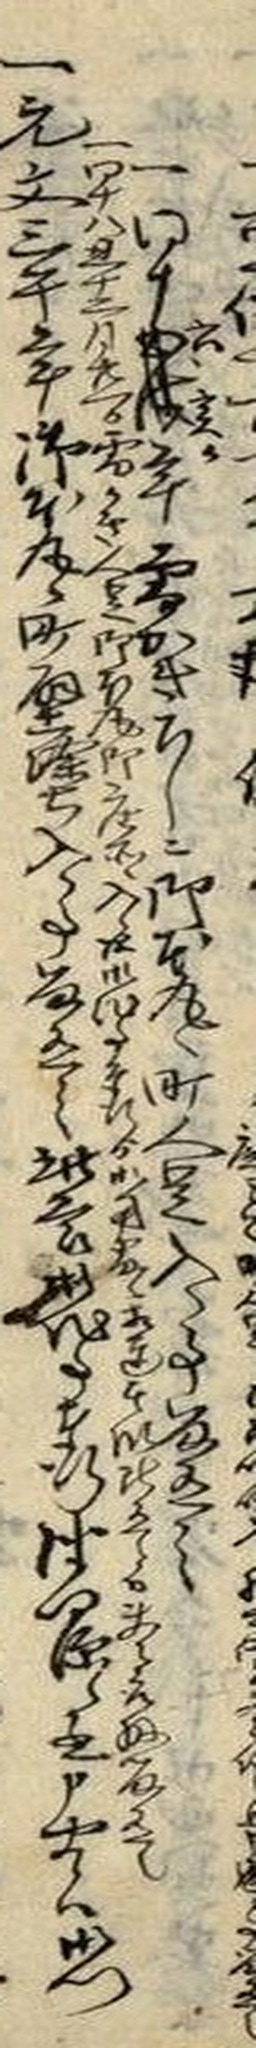一元文三午年御本丸へ町壁塗入候事留有之此節御作事奉行津田源之丞申聞候は御門
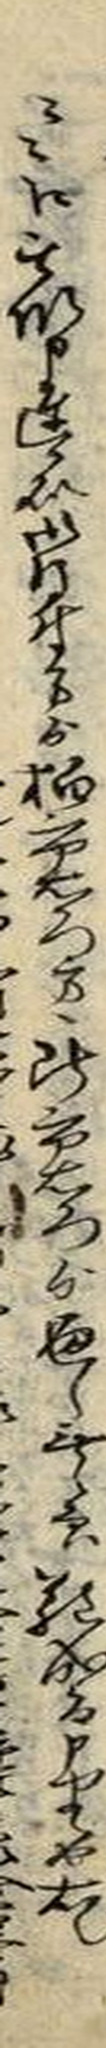々々え其段申達候処御目付方ゟ狛市右衛門方へ断市右衛門ゟ通し無之ては難成旨申聞候由右之
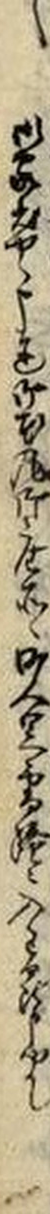御家老中へ申達御本丸御座所へ町人足雪掻に入候旨断申聞候

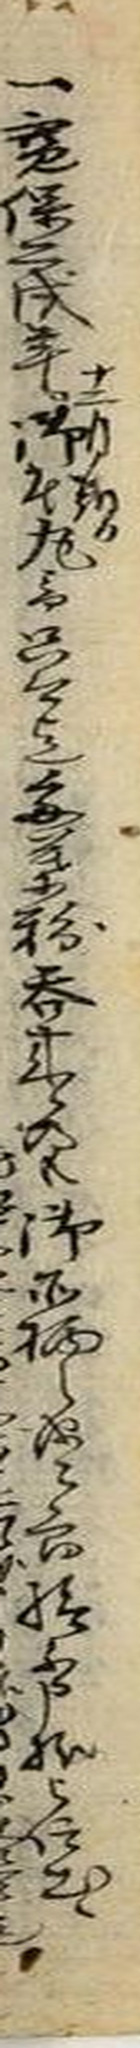一寛保二戌年十二月朔日御本丸にて只今迄多葉粉呑来候得共御所柄之儀に候間給不申様被仰出候
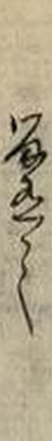留有之
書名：御城下諸事之部
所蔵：福井県文書館 Fukui Prefectural Archives
